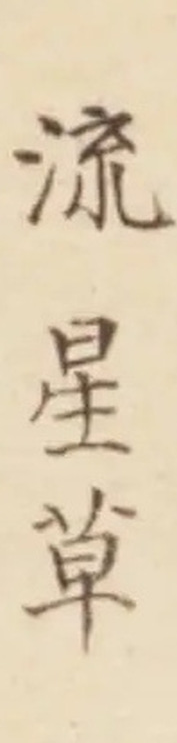流星草
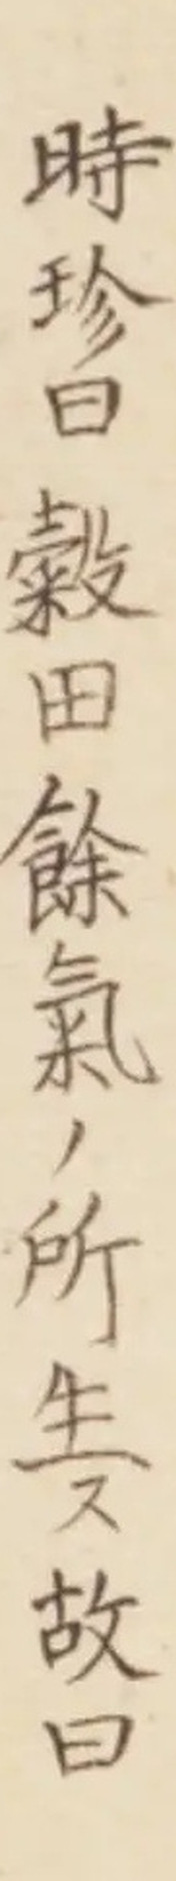時珍曰穀田余気ノ所生故曰
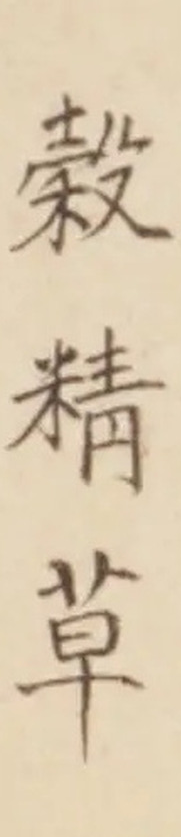穀精草
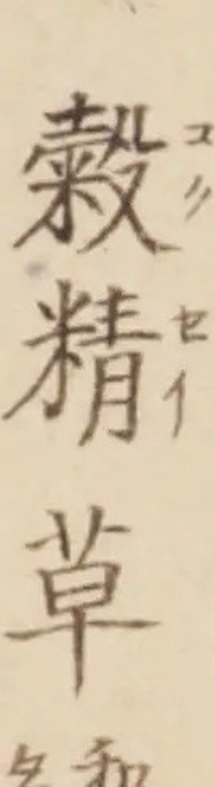穀精草
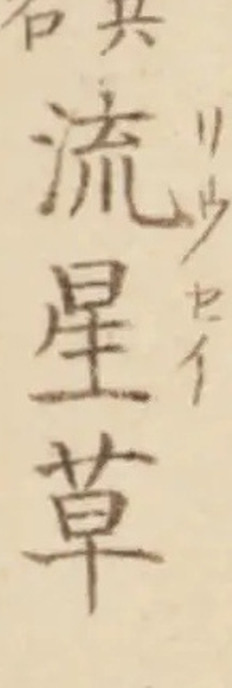流星草
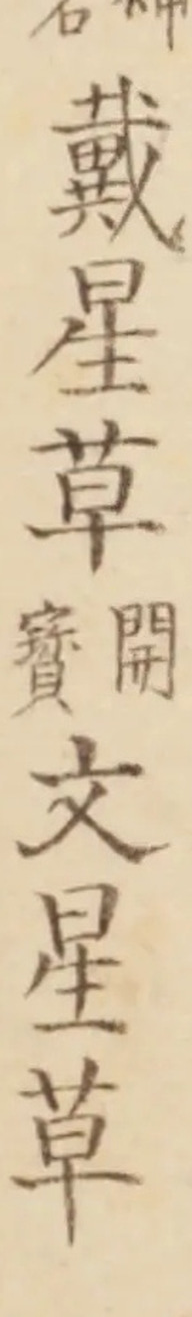戴星草文星艸

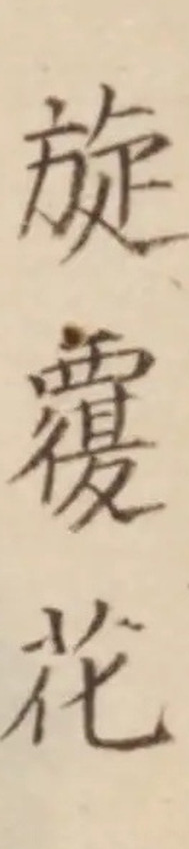旋覆花
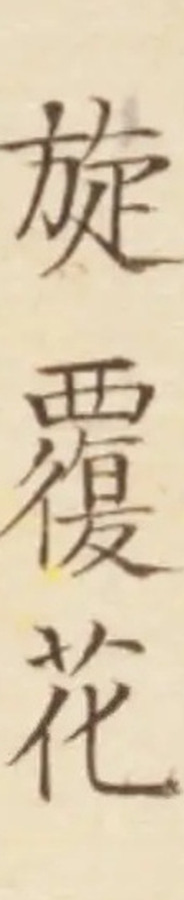旋覆花
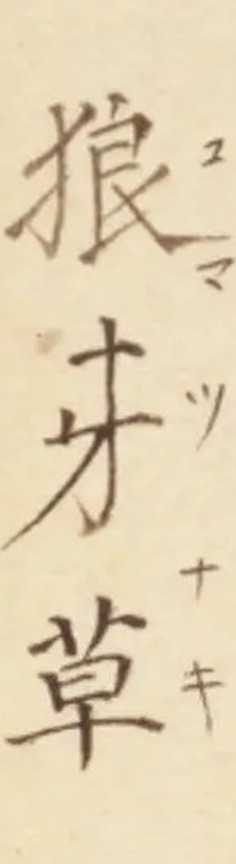狼牙草
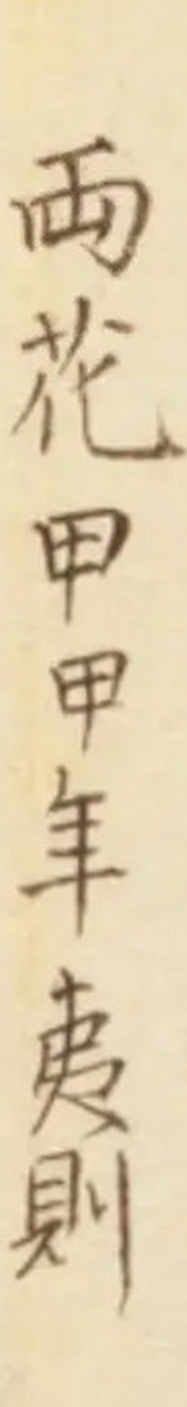両花甲甲年夷則
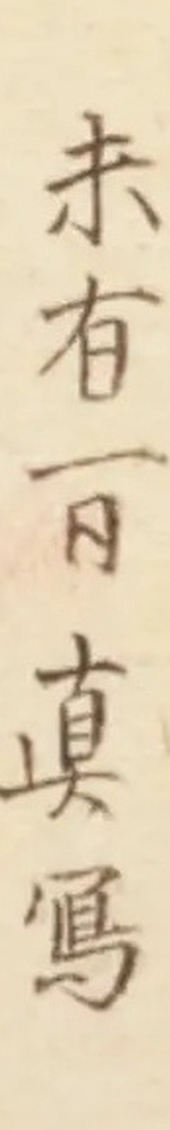未有一日真写
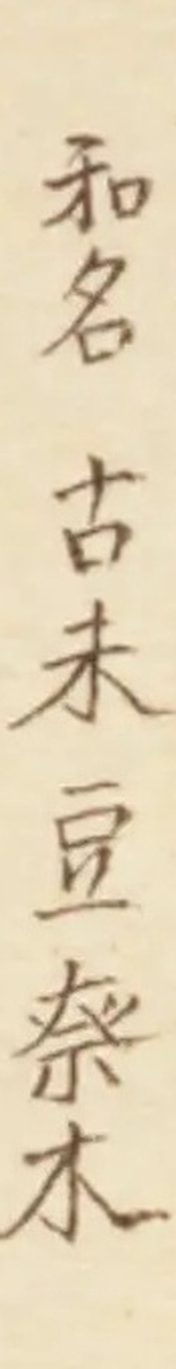和名古未豆𥘾木
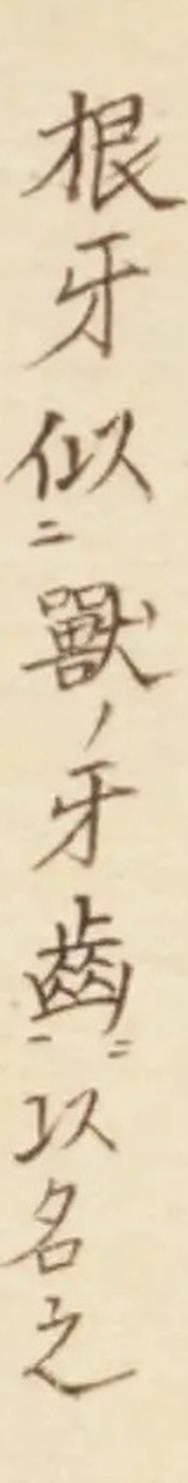根牙似獣ノ牙歯以名之
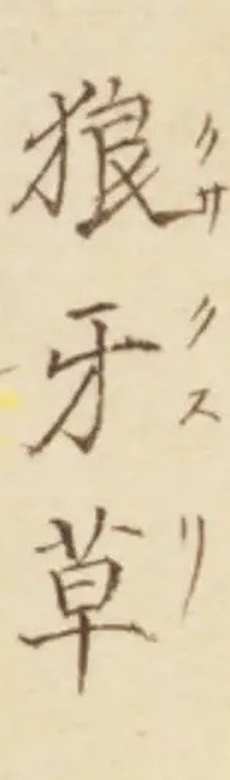狼牙草
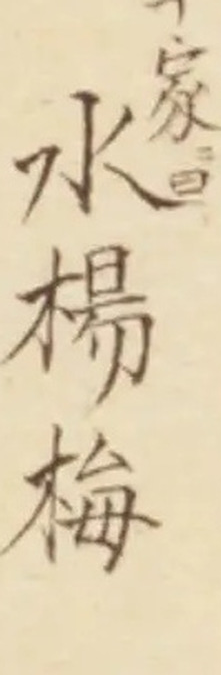水楊梅
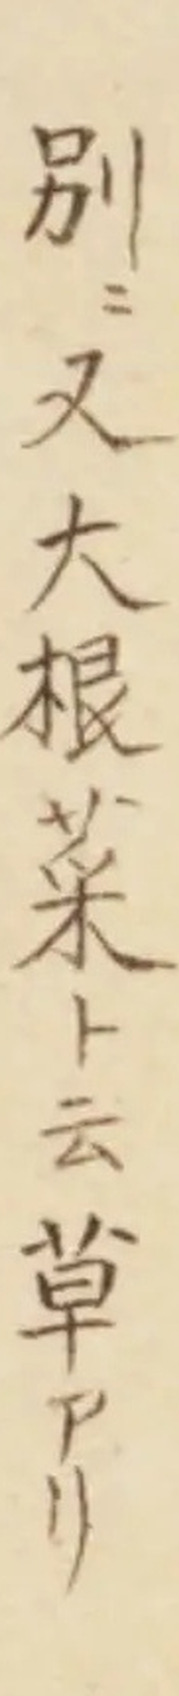別又大根菜ト云草アリ
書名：梅園草木花譜秋之部. 2
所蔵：国立国会図書館 National Diet Library, JAPAN
